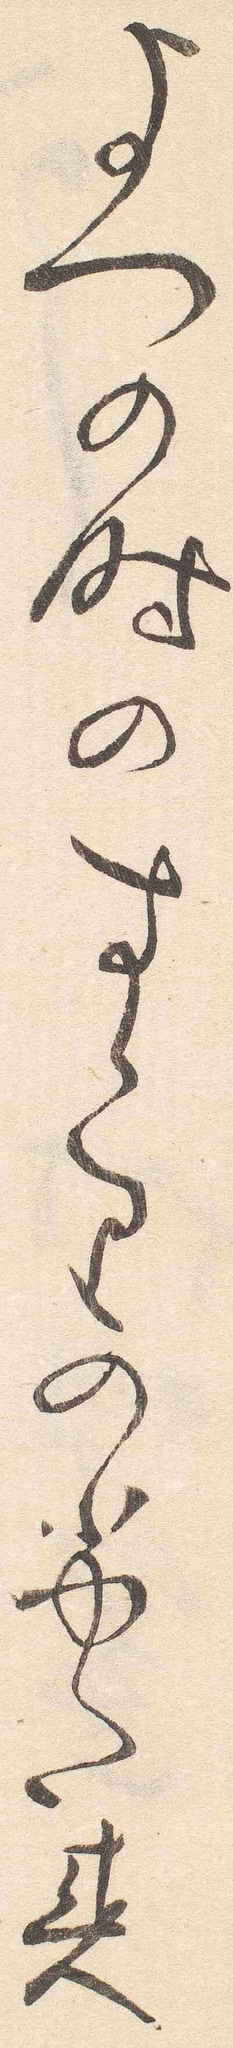よつの時のすゝりのふた春
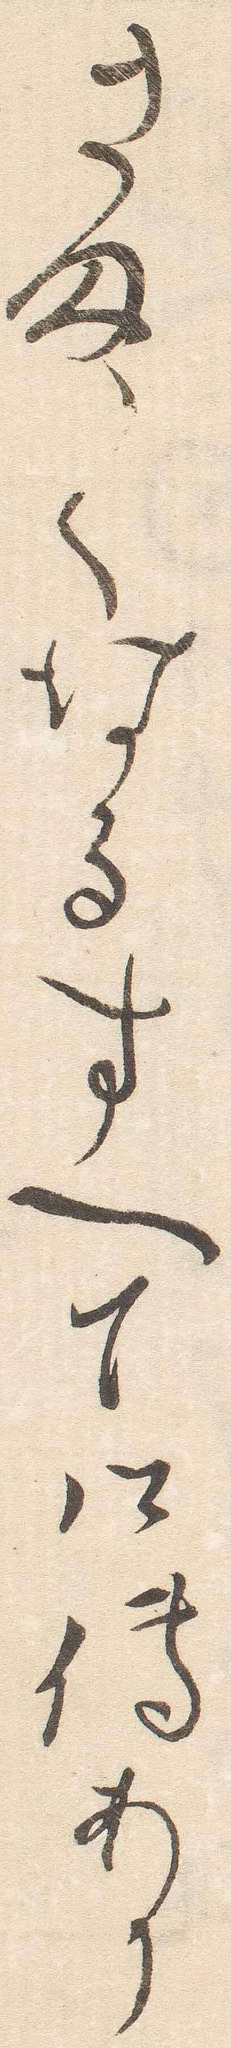さま〳〵なるすへて口伝あり
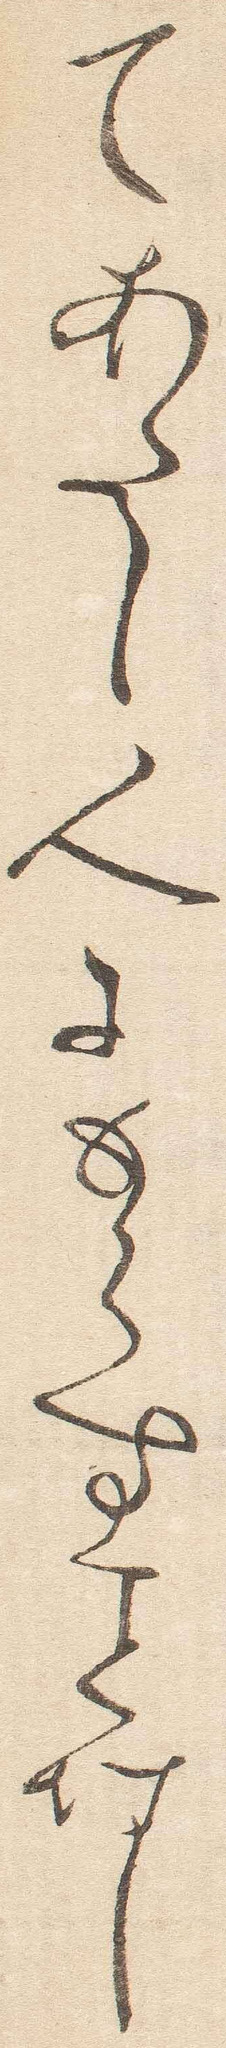てあたし人にもらすことなし

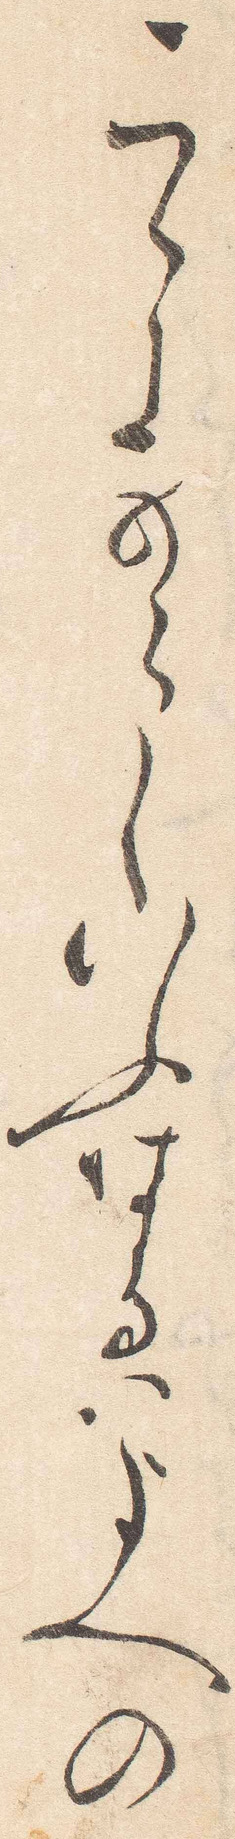こゝにもらしいふはるはよへの
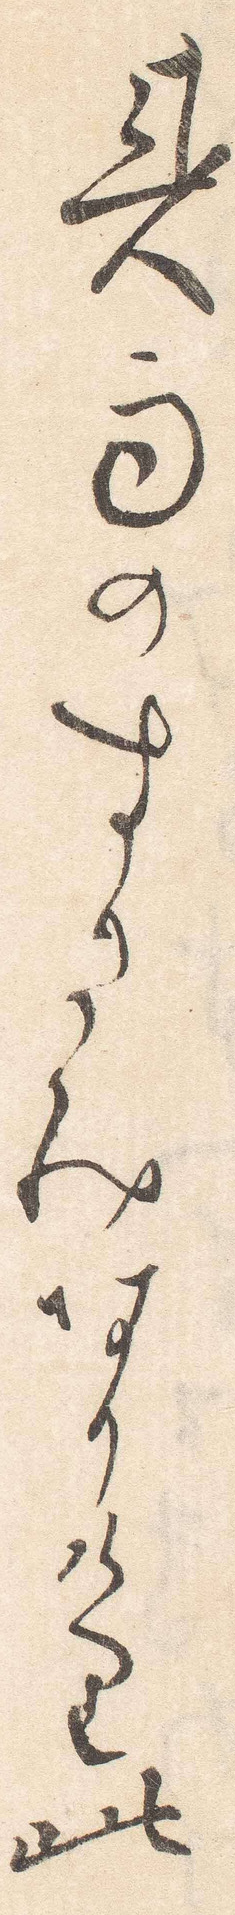春雨のすさみなりけり此
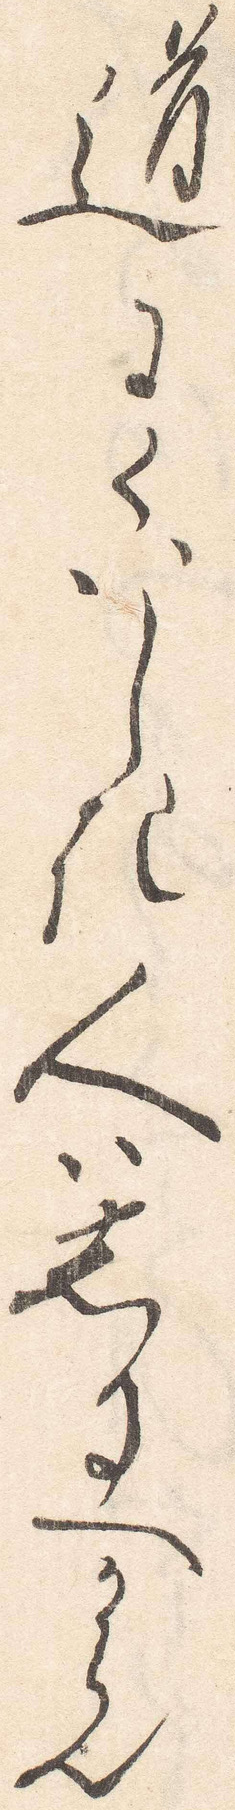道にくはしき人はしるへからん
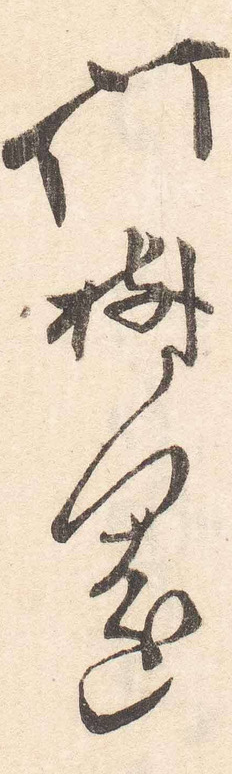門樹園
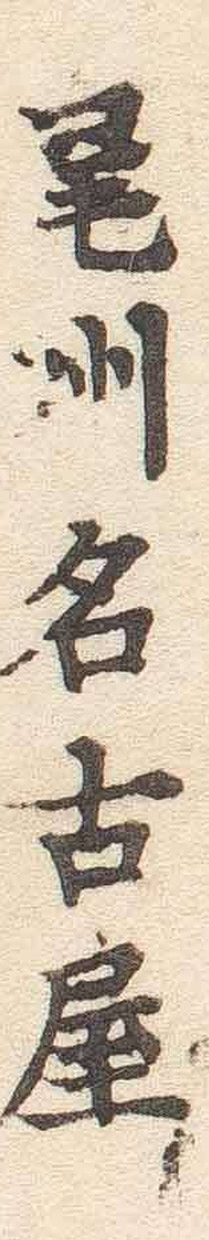尾州名古屋
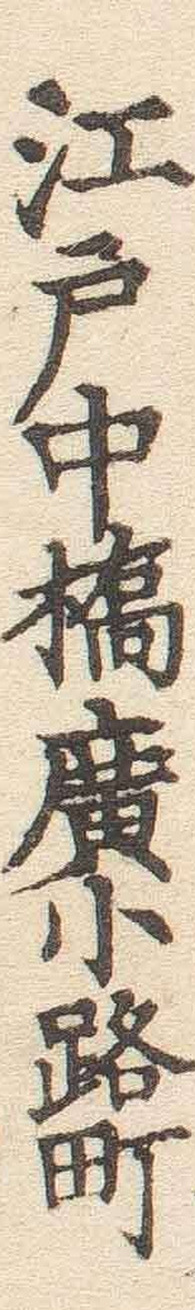江戸中橋広小路町
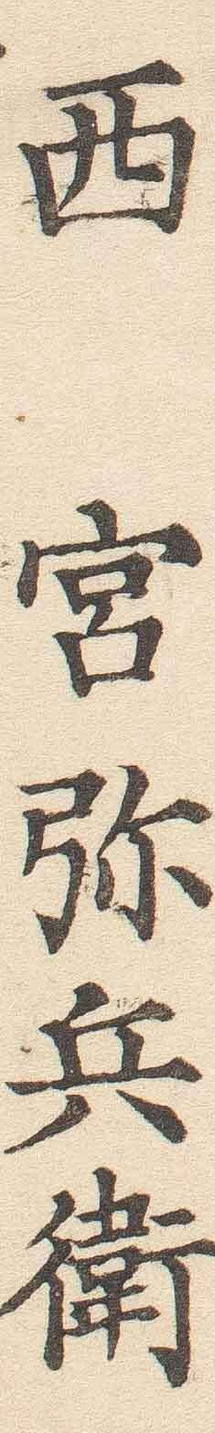西宮弥兵衛
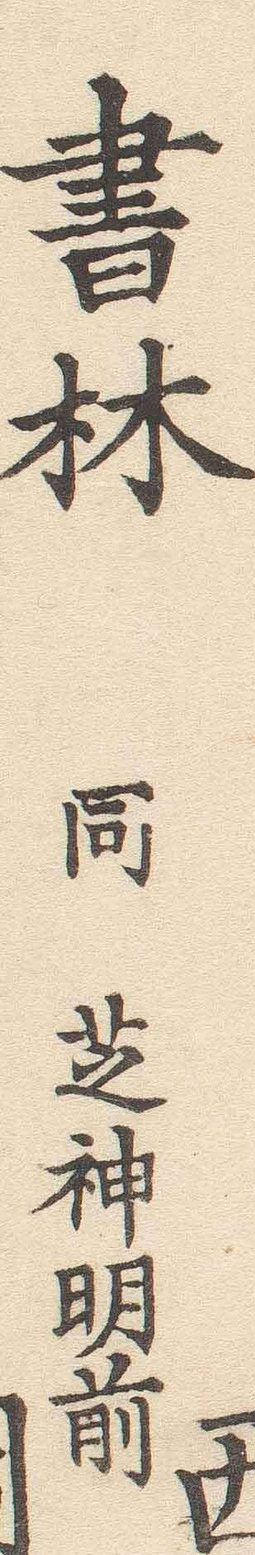書林同芝神明前
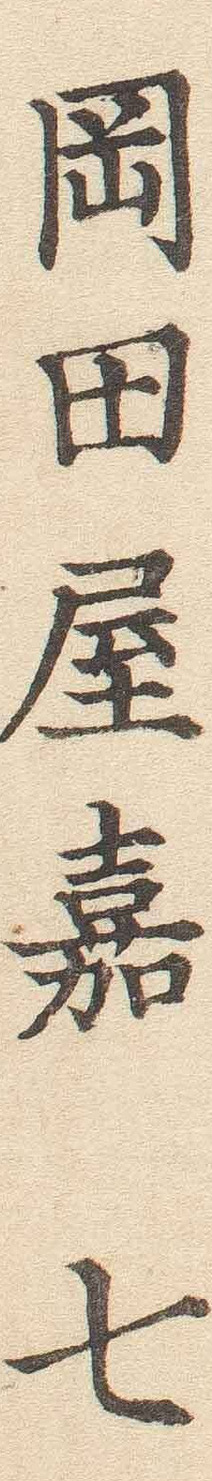岡田屋嘉七
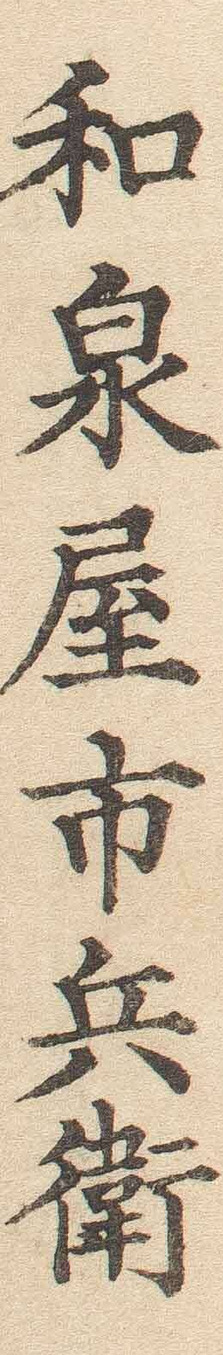和泉屋市兵衛
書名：料理通
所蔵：東京学芸大学附属図書館 国文学研究資料館
